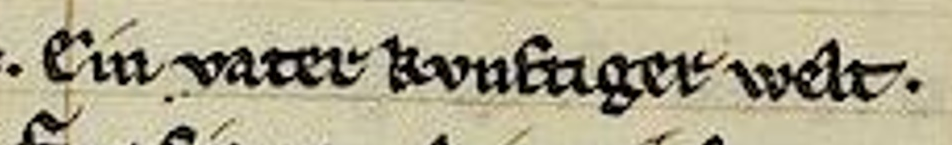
Ein vater kvnftiger welt.
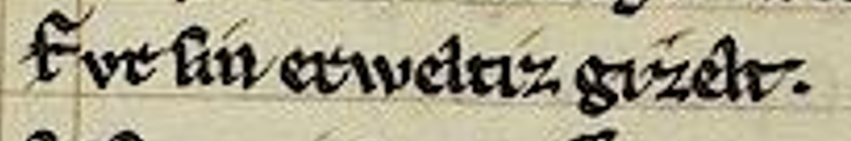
Fvr ſin erweltiz gizelt.
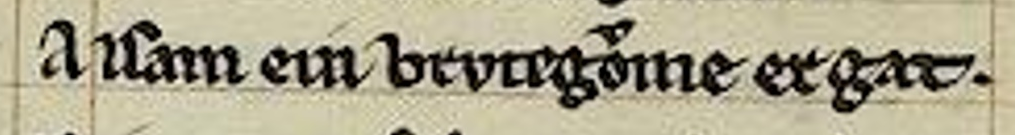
Alſam ein brutego°vme er gat.
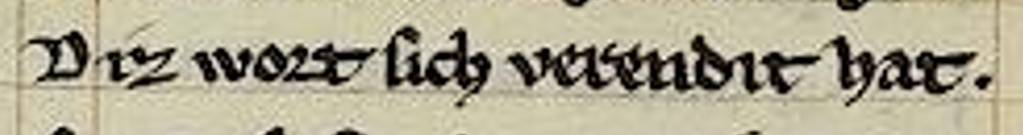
Diz wort ſich verendit hat.
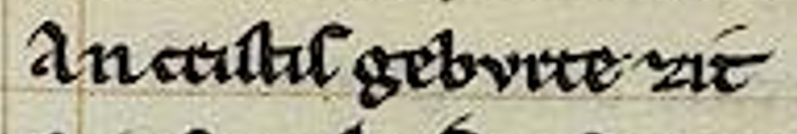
An crivtiſ gebvrte zit
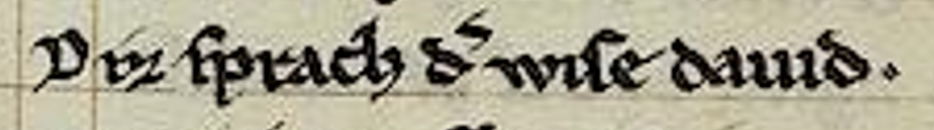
Diz ſprach d(er) wiſe dauid.
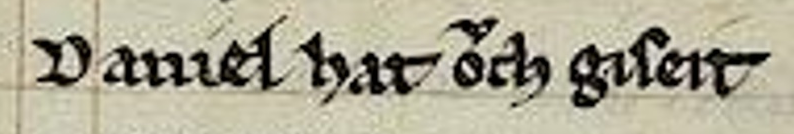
Daniel hat o°vch geſeit
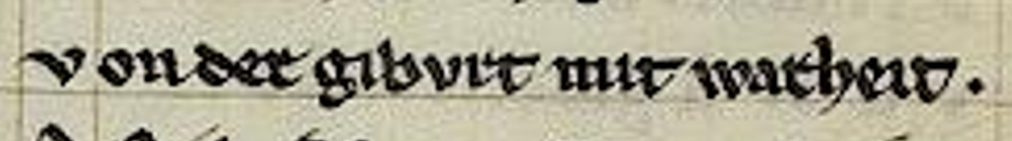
Von der gibvrt mit warheit.
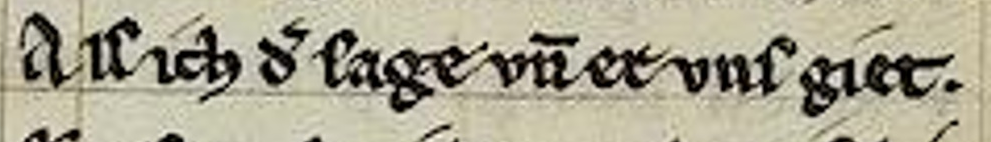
Alſ ich d(er) ſage vn(d) er vnſ giet.
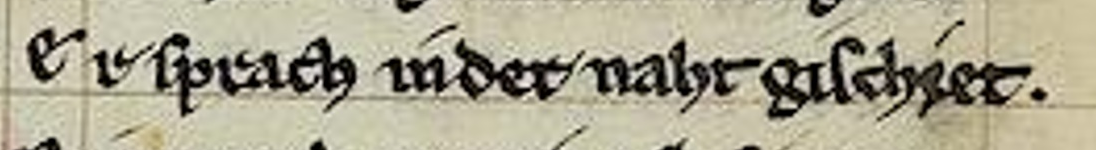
Er ſprach in der naht giſchiet.
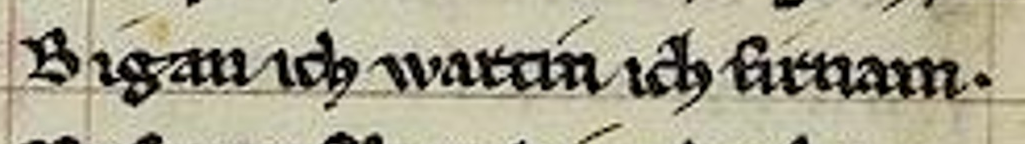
Bigan ich wartin ich firnam.
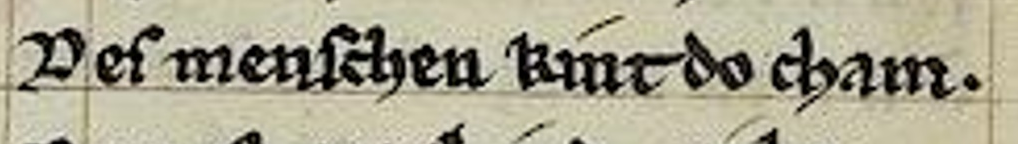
Deſ menſchen kint do cham.
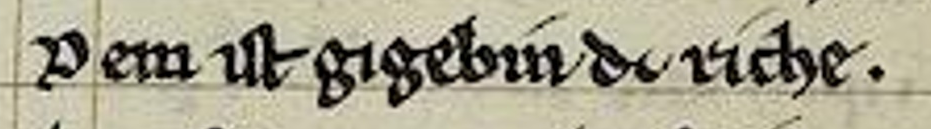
Dem iſt gigebin d(az) riche.
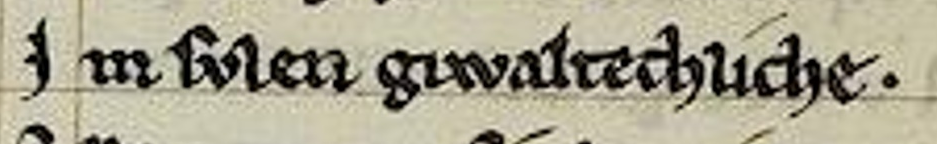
Im ſvlen giwaltechliche.
